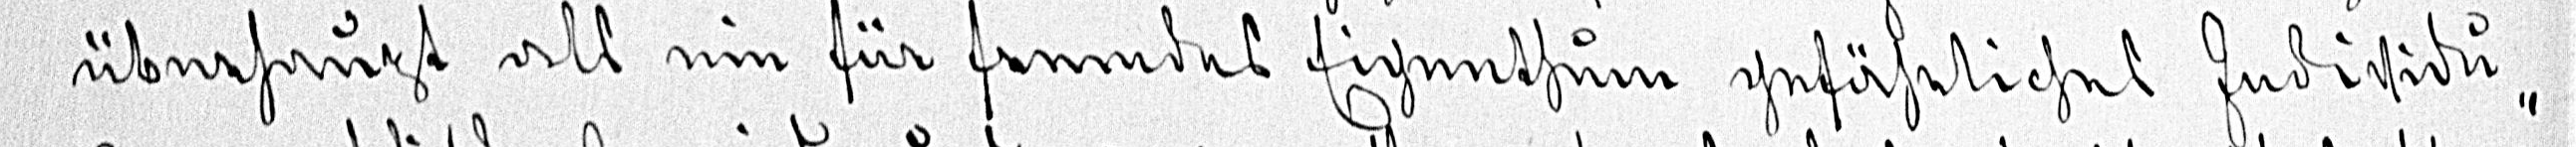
überhaupt als ein für fremdes Eigenthum gefährliches Individu¬
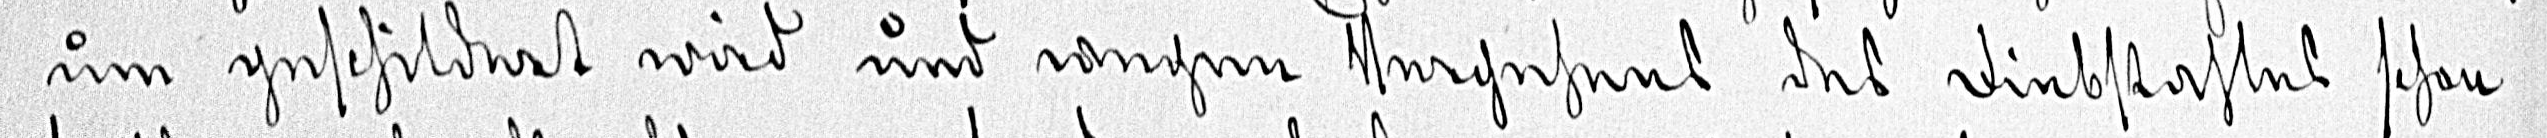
um geschildert wird und wegen Vergehens des Diebstahles schon
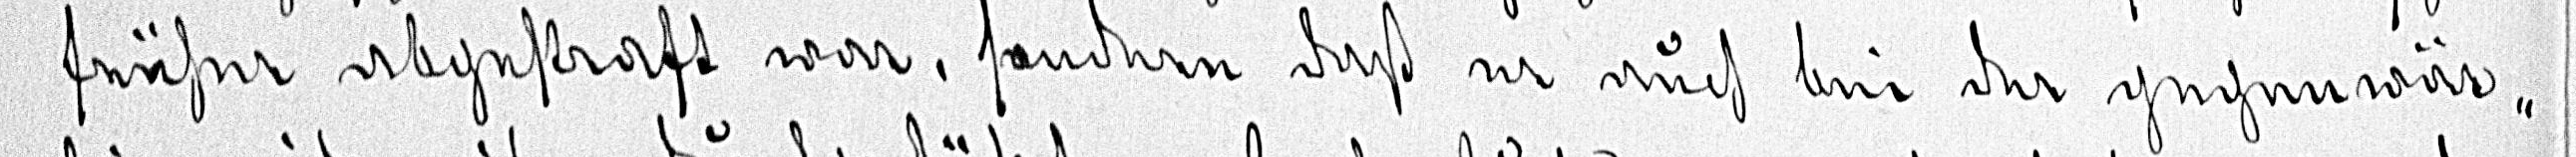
früher abgestraft war, sondern daß er auch bei der gegenwär¬
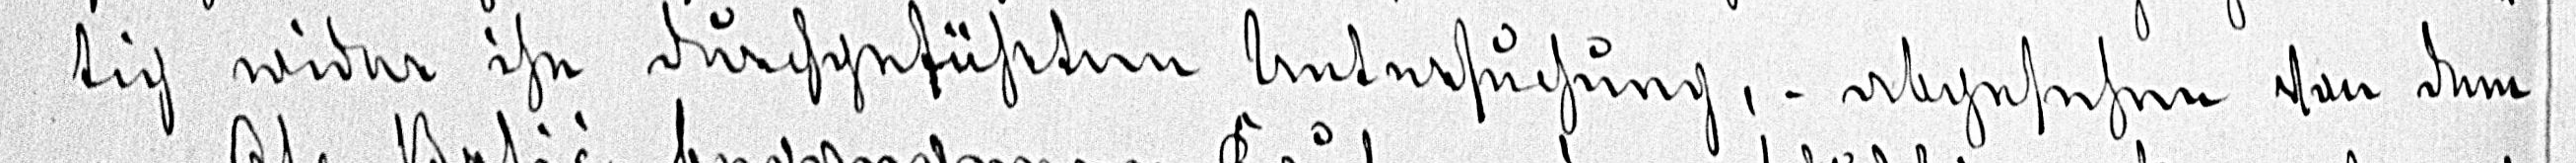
tig wider ihn durchgeführten Untersuchung,- abgesehen von dem
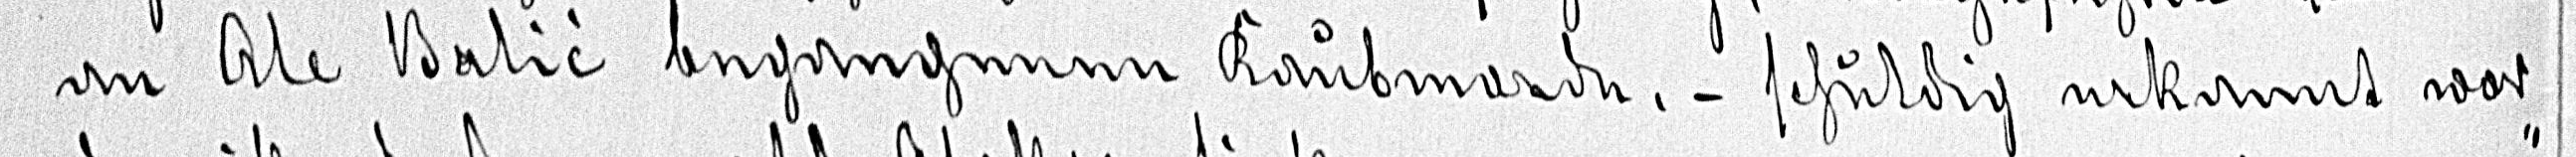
an Ale Balić begangenen Raubmorde,- schuldig erkannt wor¬
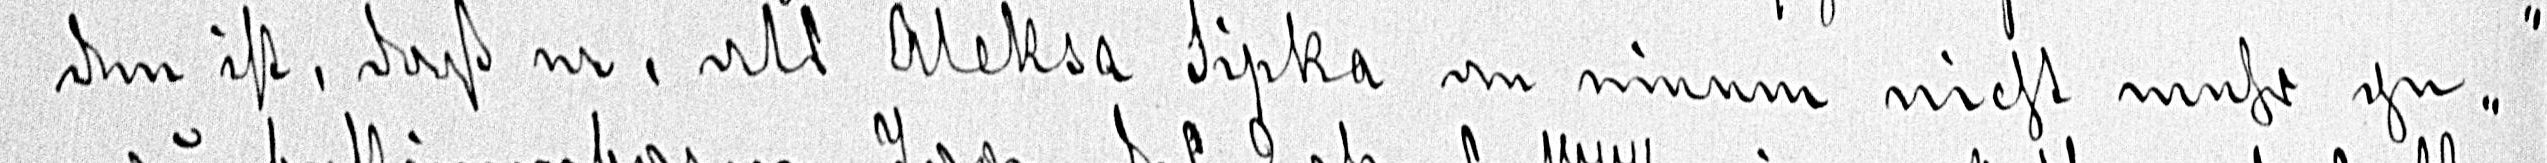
den ist, daß er, als Aleksa Jipka an einem nicht mehr ge¬
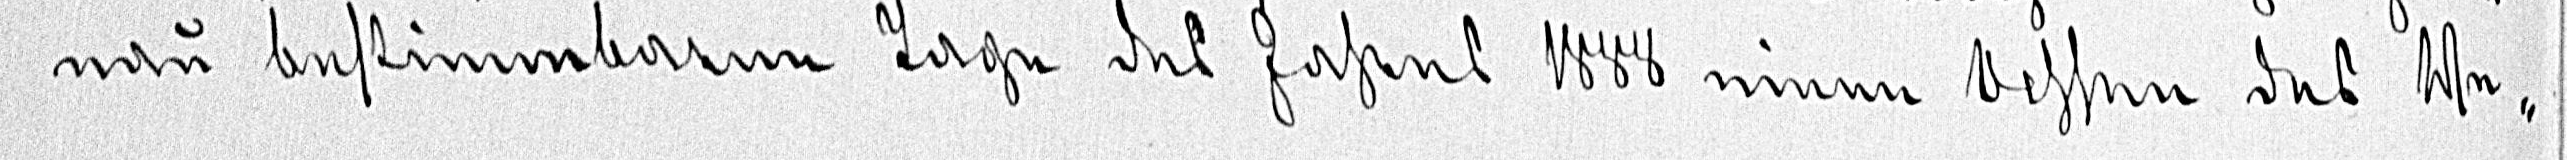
nau bestimmbaren Tage des Jahres 1888 einen Ochsen des We¬
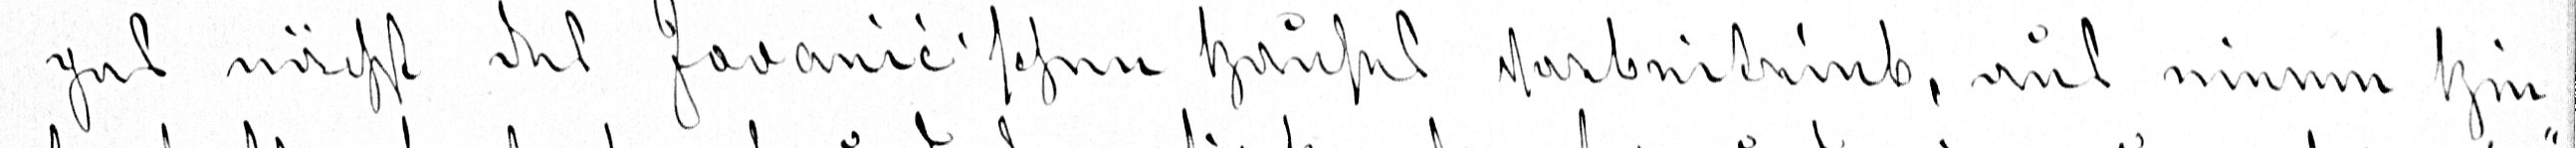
ges nächst des Jovanić'schen Hauses vorbeitrieb, aus einem Hin¬
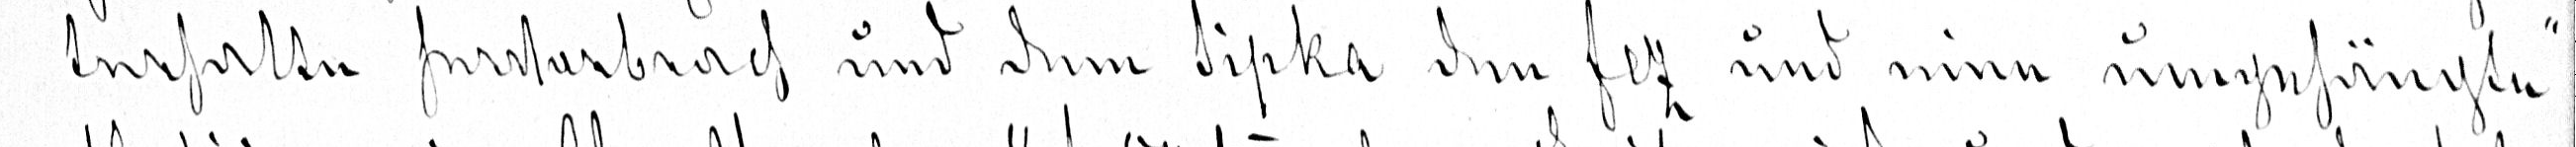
terhalte hervorbrach und dem Jipka den Fez und eine umgehängte
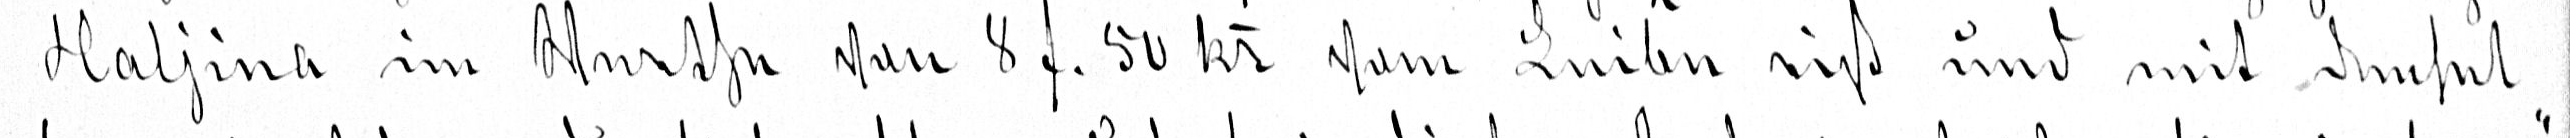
Haljina im Werthe von 8f. 50kr vom Leibe riß und mit densel¬
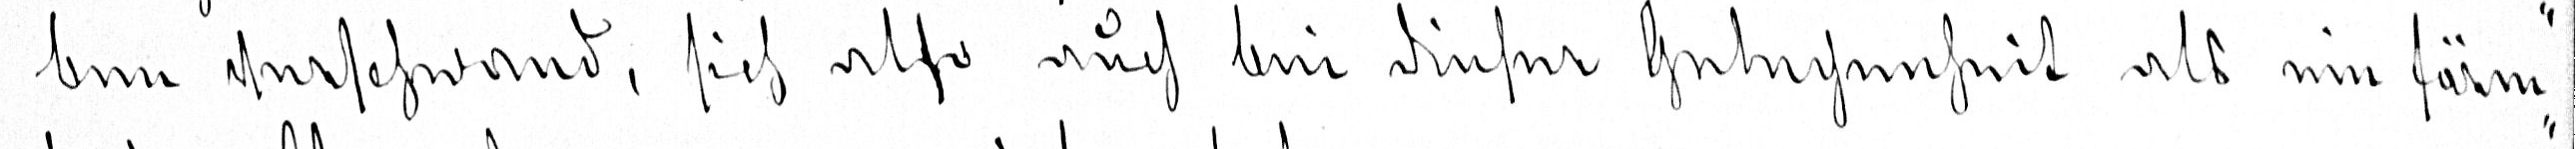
ben verschwand, sich also auch bei dieser Gelegenheit als ein förm¬
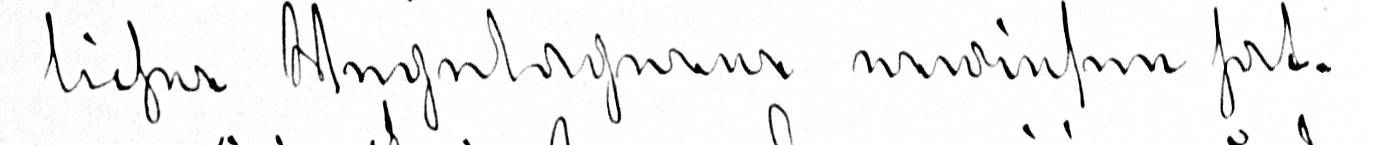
licher Wegelagerer erwiesen hat.
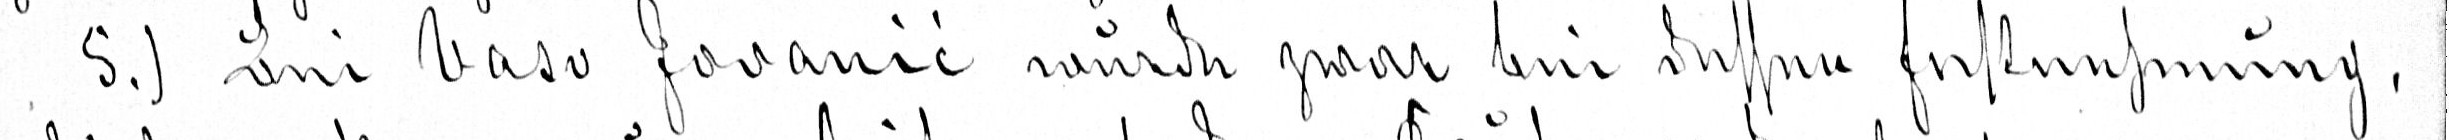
5.) Bei Vaso Jovanić wurde zwar bei dessen Festnehmung,
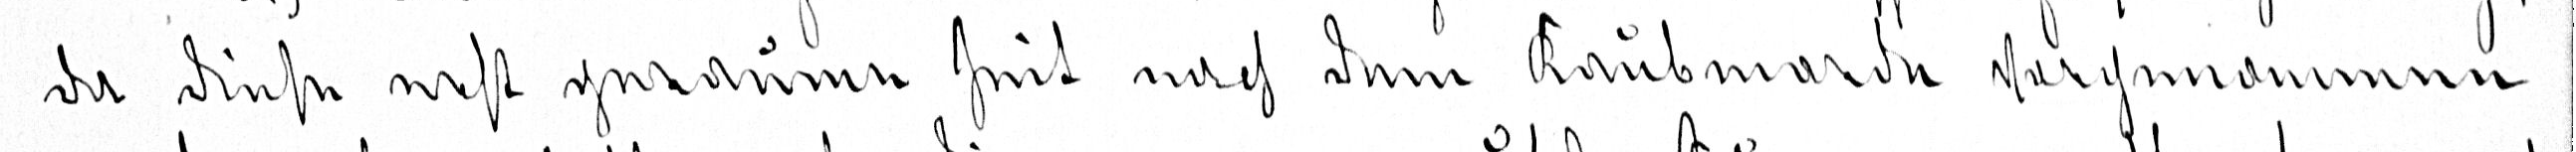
da diese erst geraume Zeit nach dem Raubmorde vorgenommen
